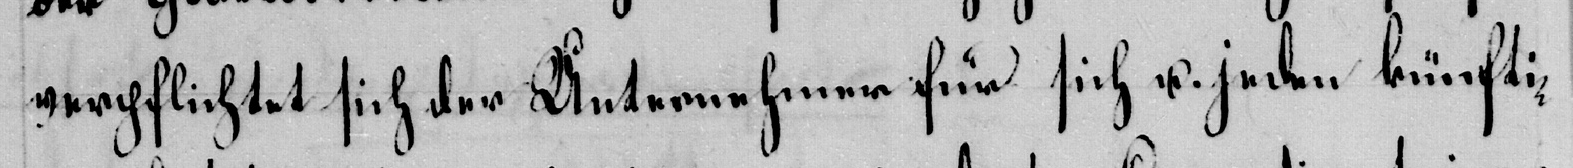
verpflichtet sich der Unternehmer für sich u. jeden künfti¬
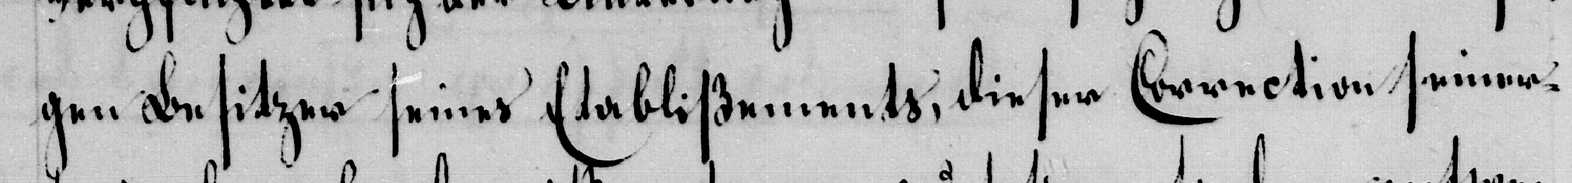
gen Besitzer seines Etablißements, dieser Correction seiners¬
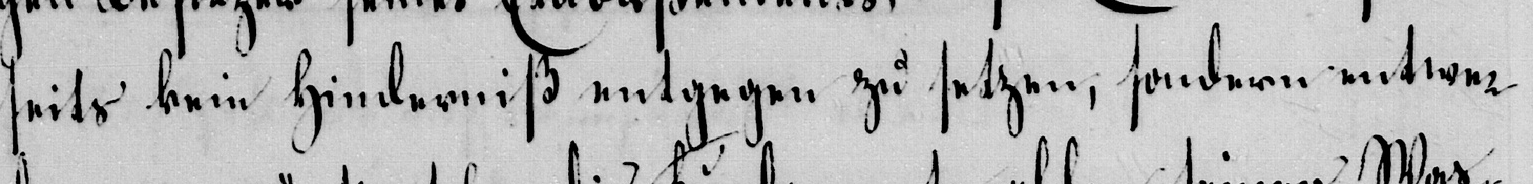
eits kein Hinderniß entgegen zu setzen, sondern entwe¬
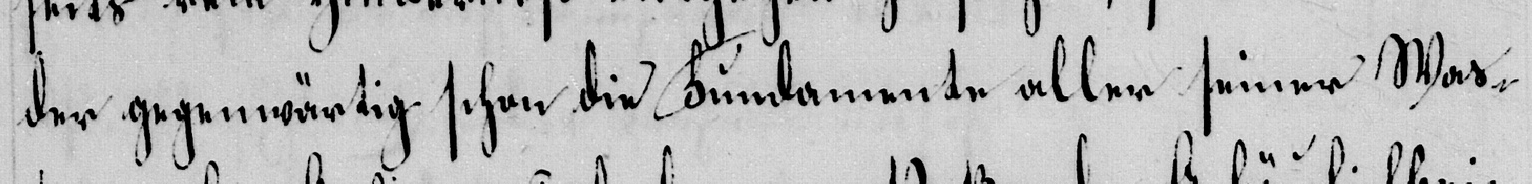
der gegenwärtig schon die Fundamente aller seiner Waß¬
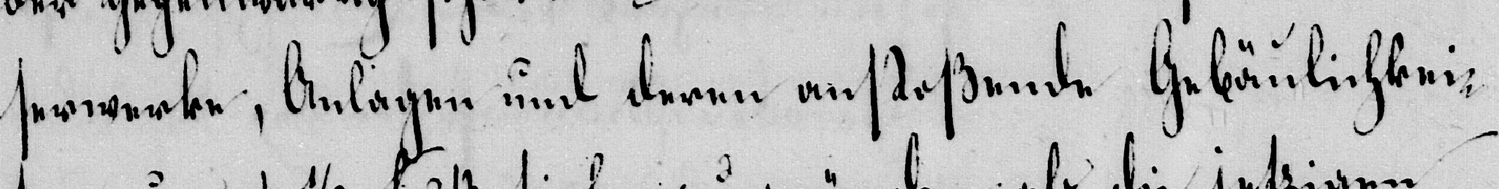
erwerke, Anlagen und deren anstoßende Gebäulichkei¬
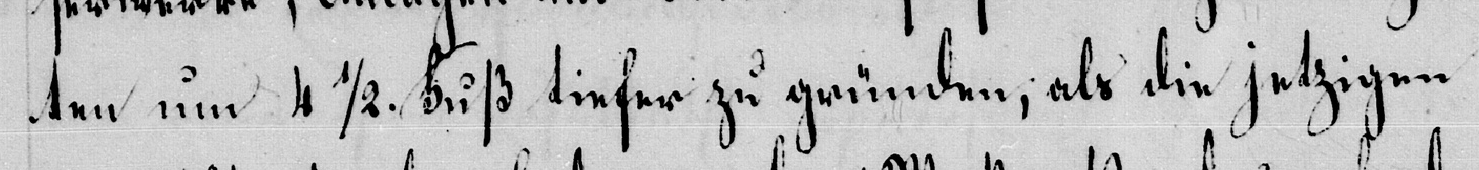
ten um 4 ½. Fuß tiefer zu gründen, als die jetzigen
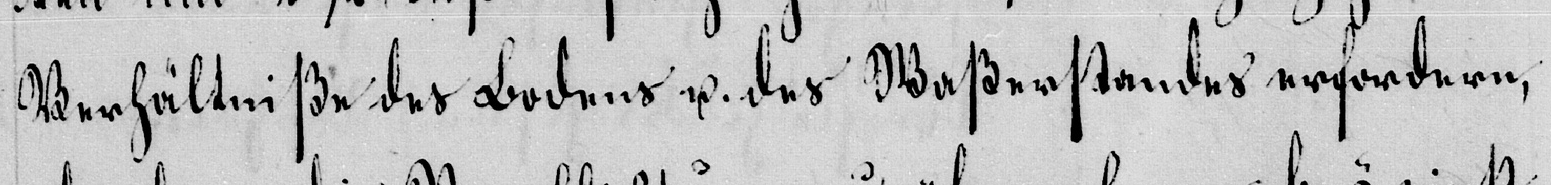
Verhältniße des Bodens u. des Waßerstandes erfordern,
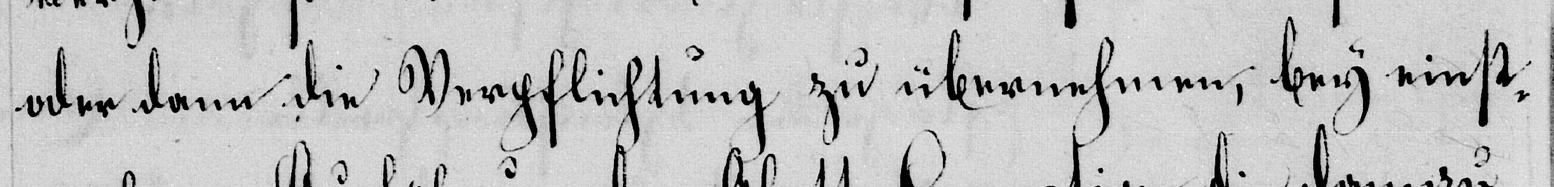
oder dann die Verpflichtung zu übernehmen, bey einst¬
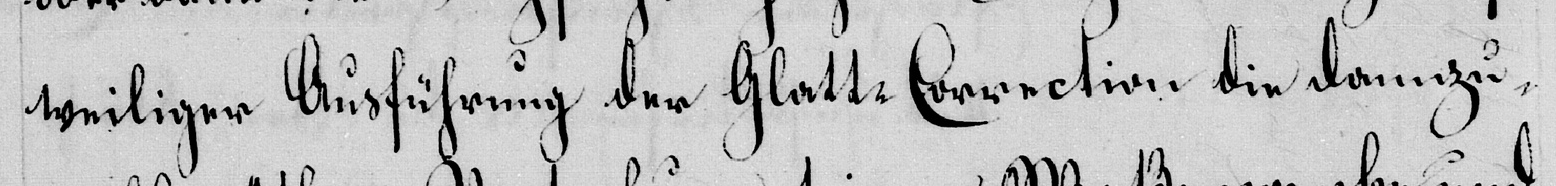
weiliger Ausführung der Glatt-Correction die dannzu¬
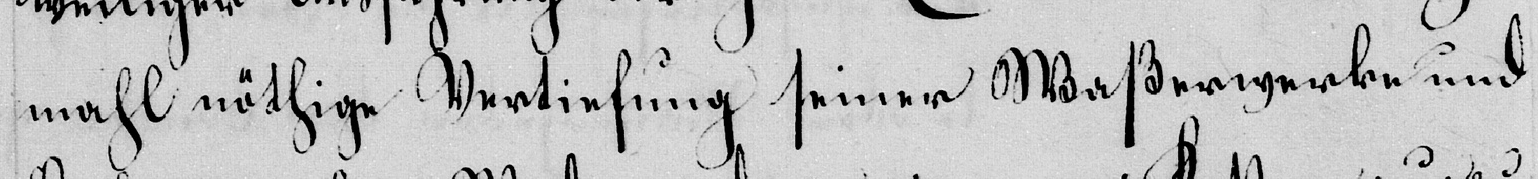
mahl nöthige Vertiefung seiner Waßerwerke und
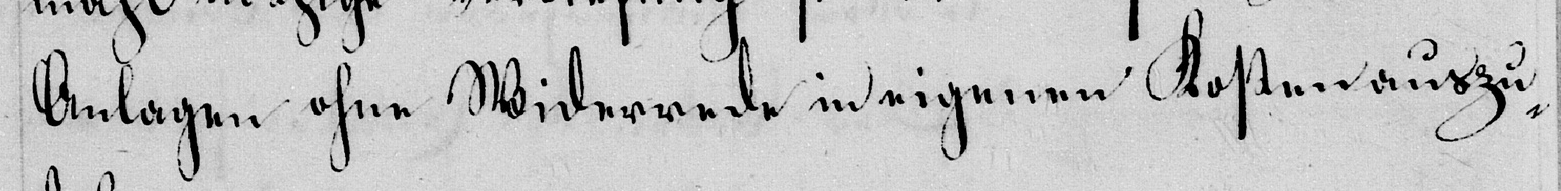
Anlagen ohne Widerrede in eigenen Kosten auszu¬
